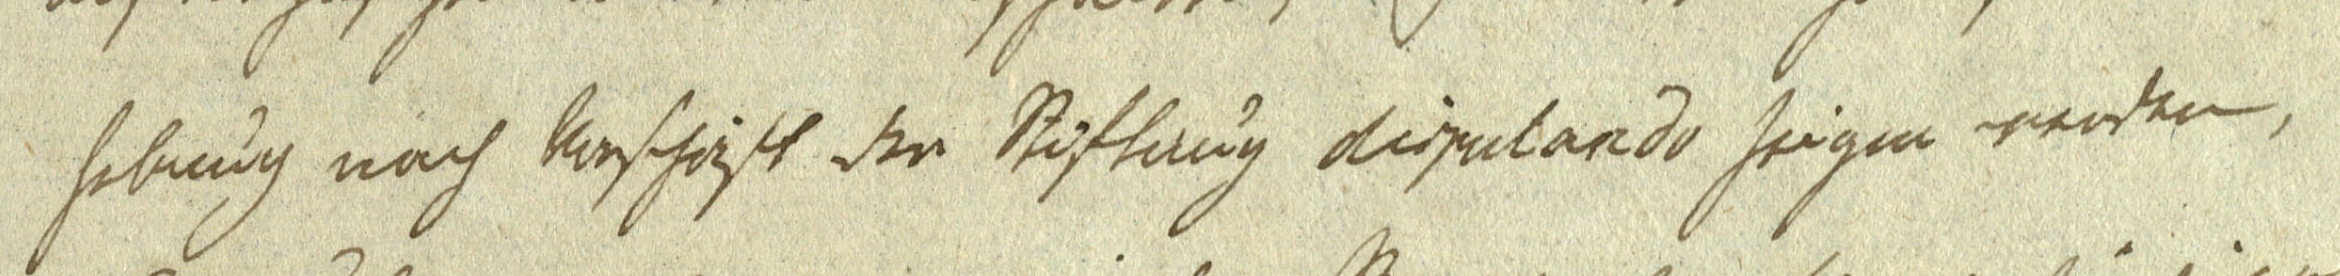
Hebung nach Vorschrift der Stiftung disputando zeigen werden,
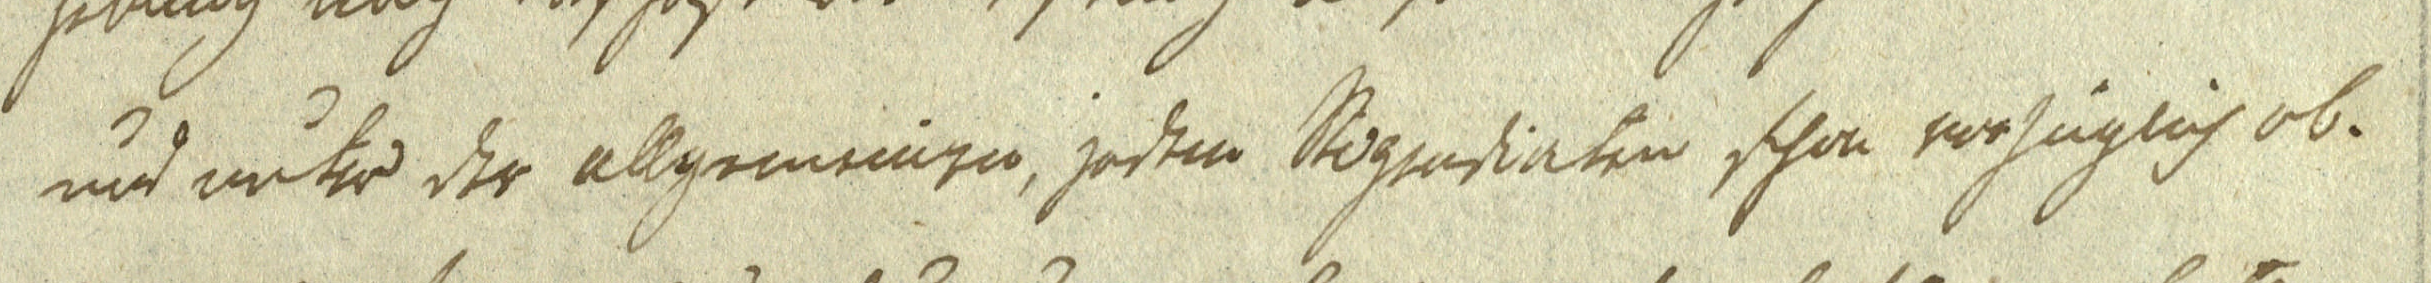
und unter der allgemeinen, jedem Stipendiaten schon vorzüglich ob¬
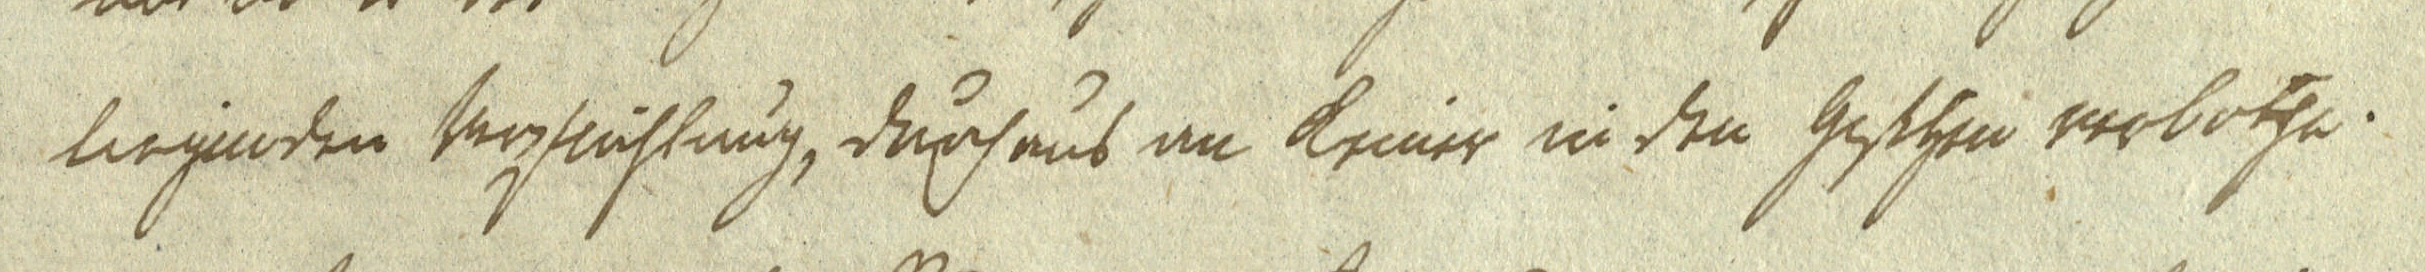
liegenden Verpflichtung, durchaus an keiner in den Gesetzen verbothe¬
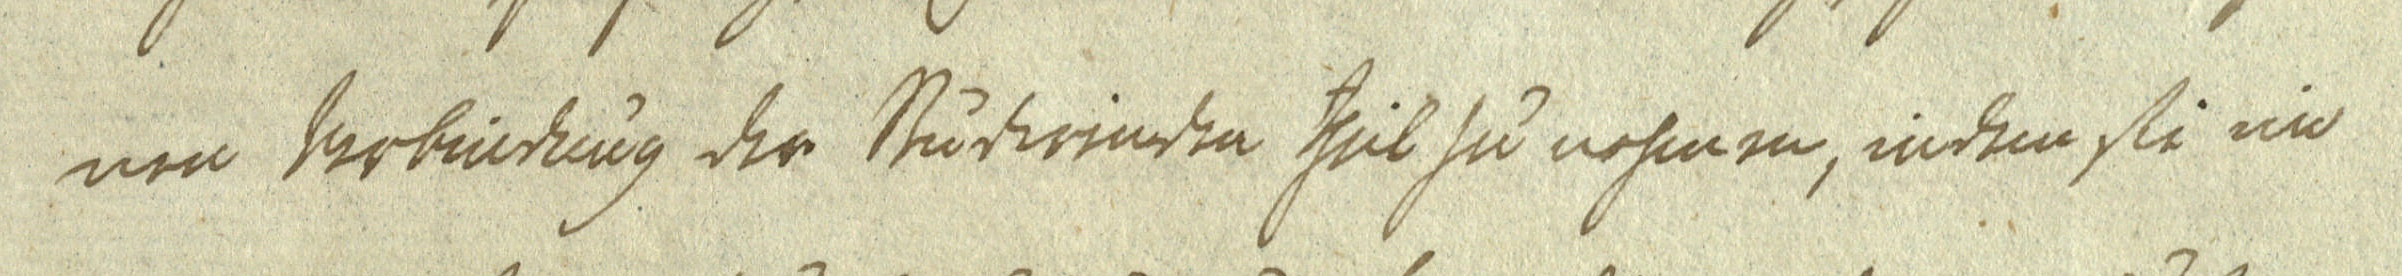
nen Verbindung der Studirenden theil zu nehmen, indem sie im
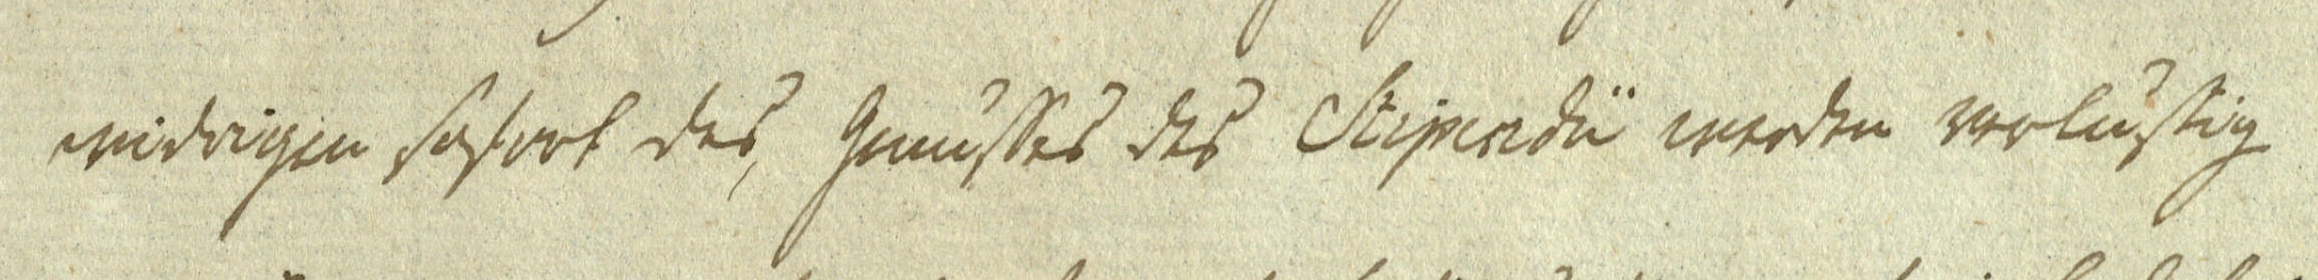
widrigen sofort des Genusses des Stipendii werden verlustig
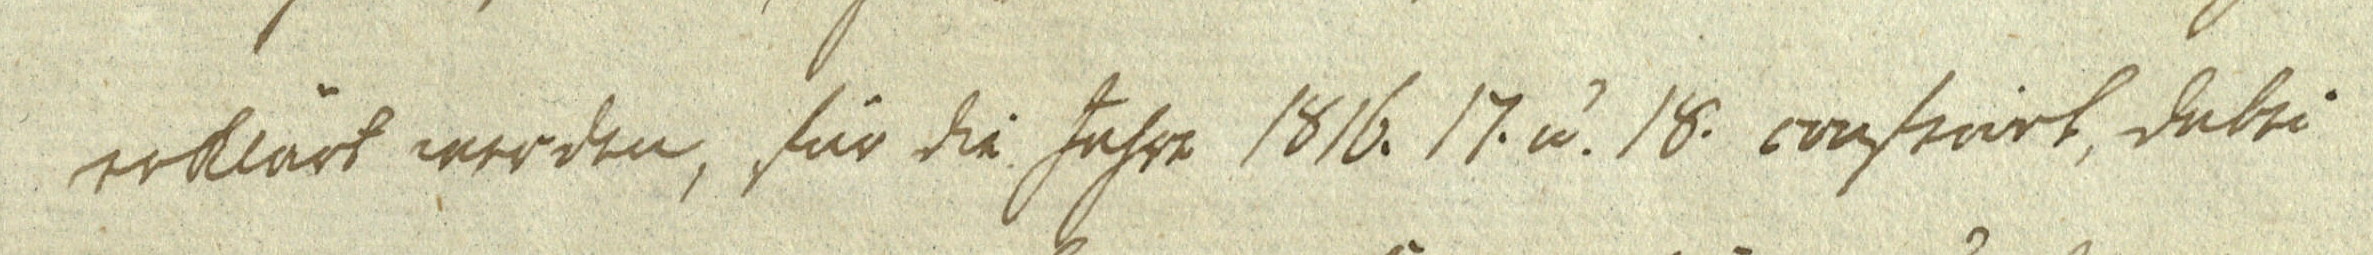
erklärt werden, für die Jahre 1816. 17 u. 18. conferirt, dabei
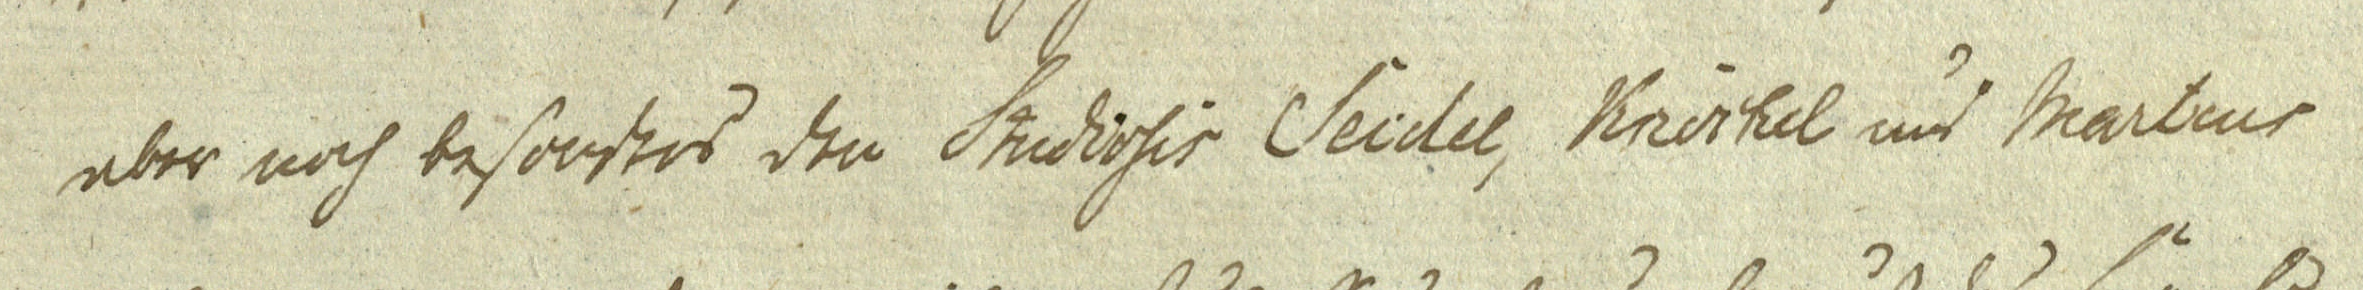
aber noch besonders den Studiosis Seidel, Knöchel und Martens
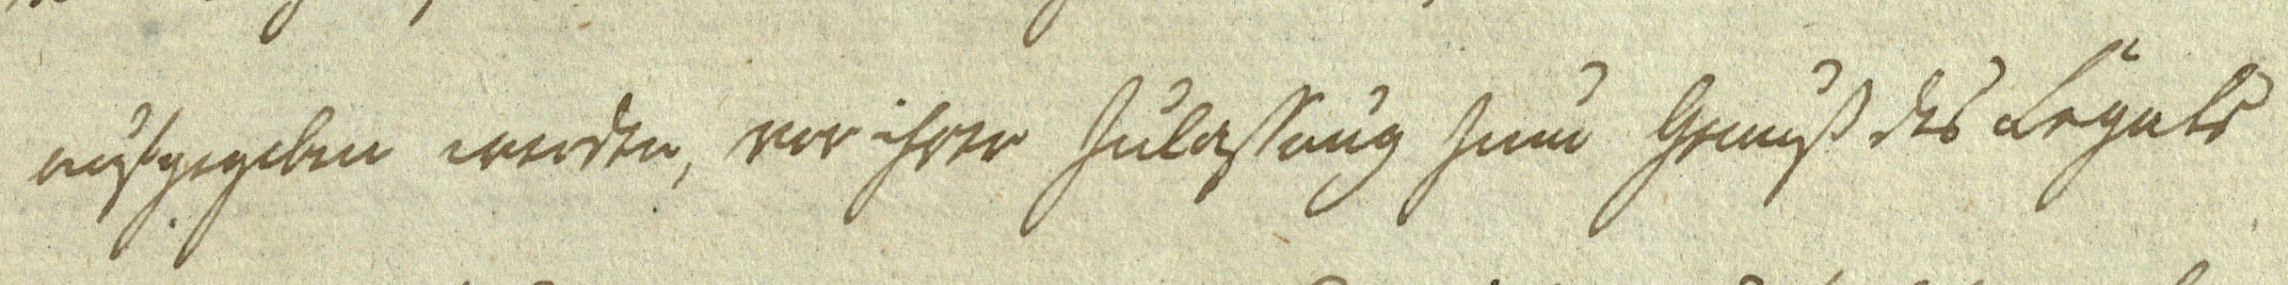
aufgegeben werden, vor ihrer Zulassung zum Genuß des Legats
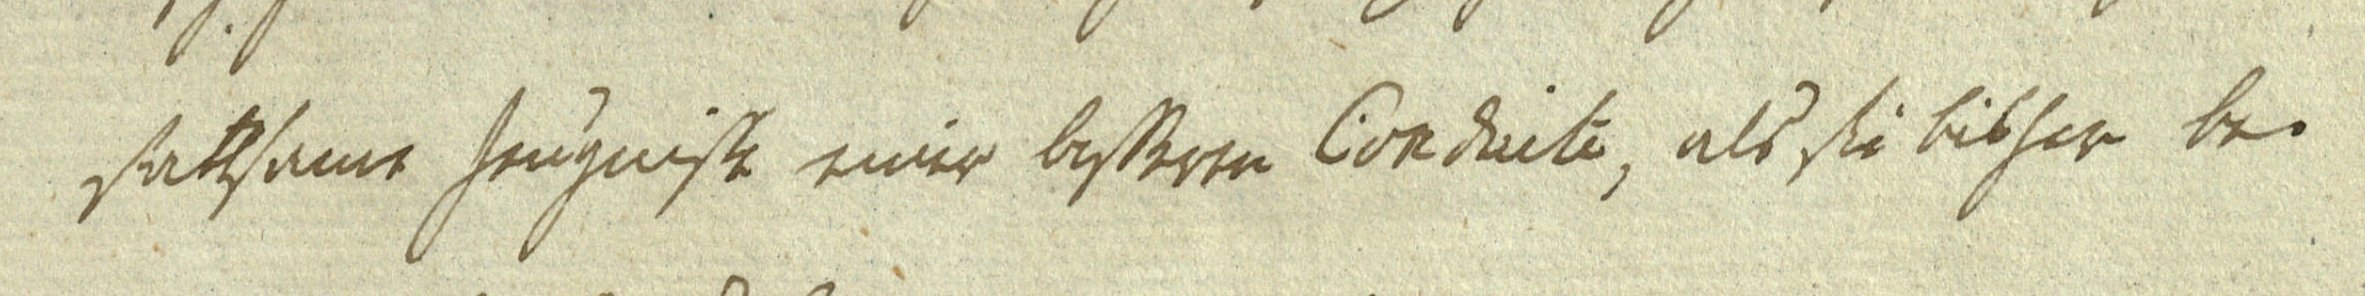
sattsame Zeugnisse einer besseren Condicte, als sie bisher be¬
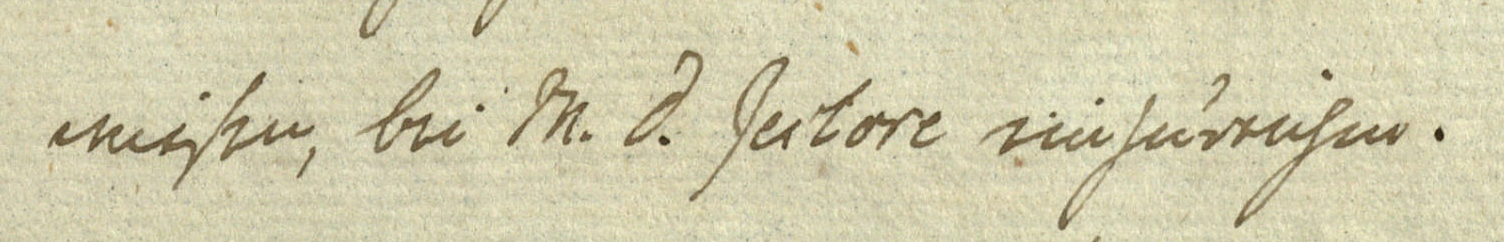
wiesen, bei M. D. Rectore einzureichen.
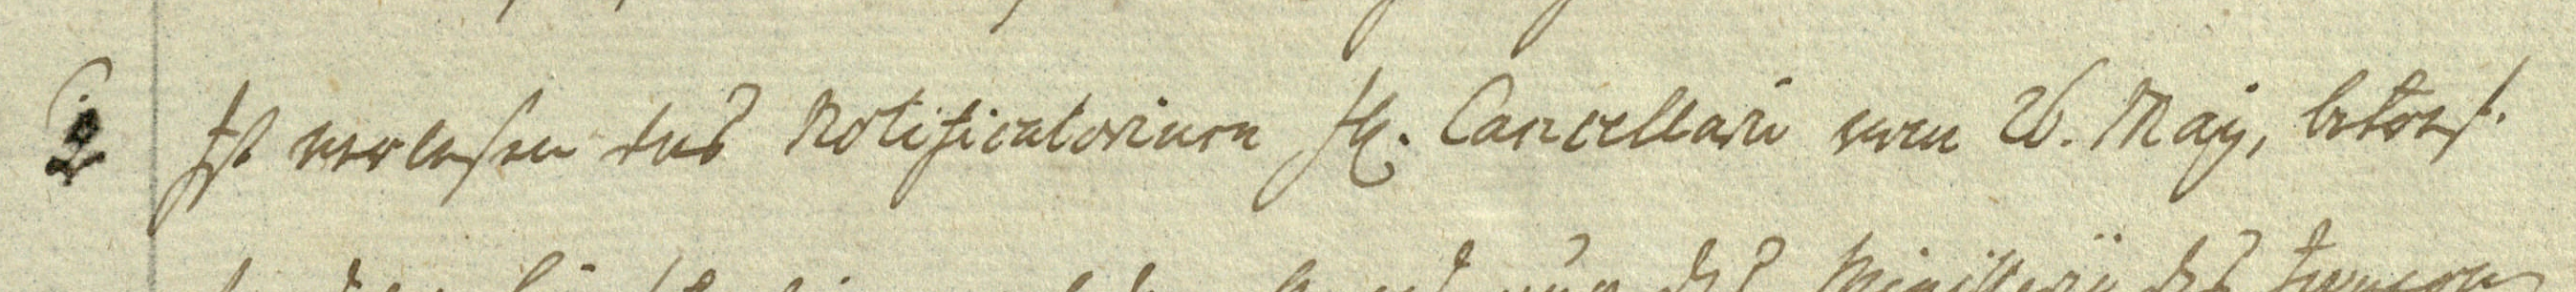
2. Ist verlesen das Notificatorium dh. Cancellarii vom 26. Maÿ, betref¬
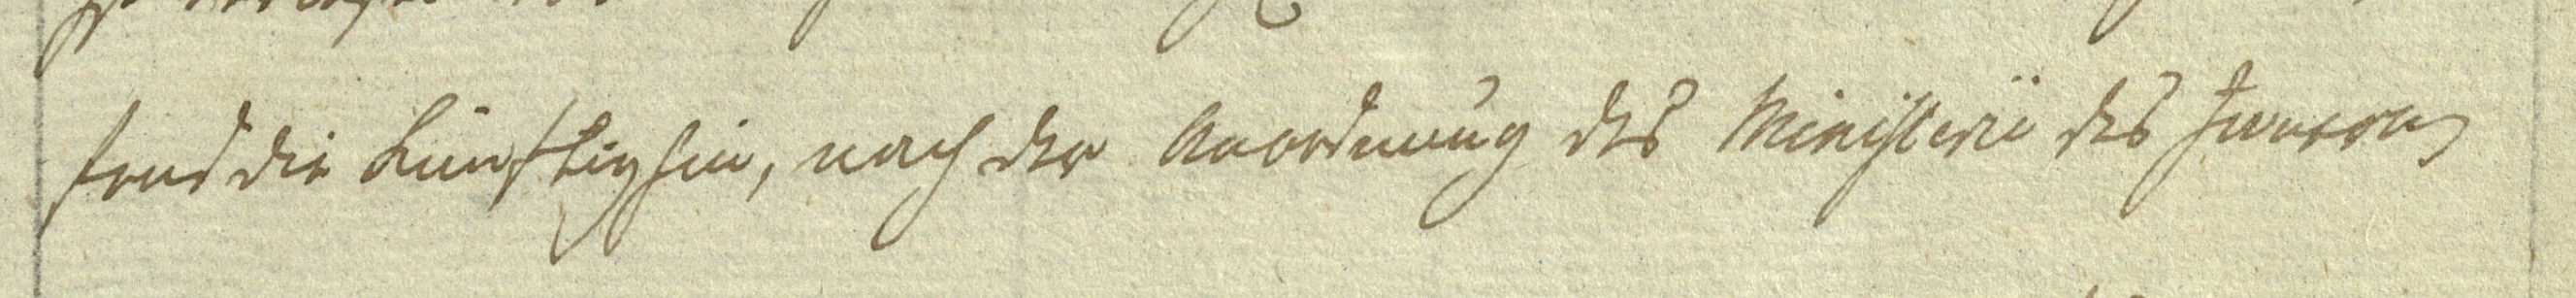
fend die künftighin, nach der Anordnung des Ministerii des Innern
